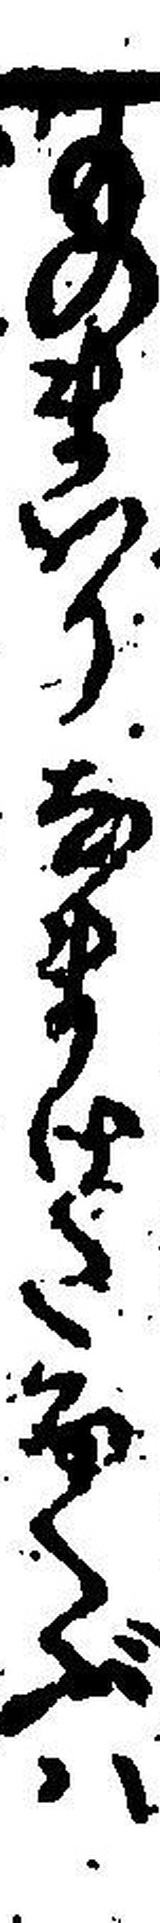ものまいりなまけたろくぶは
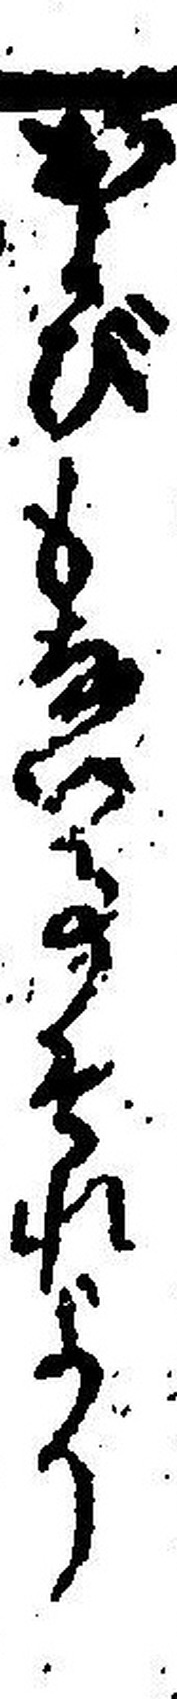およびもない事それより
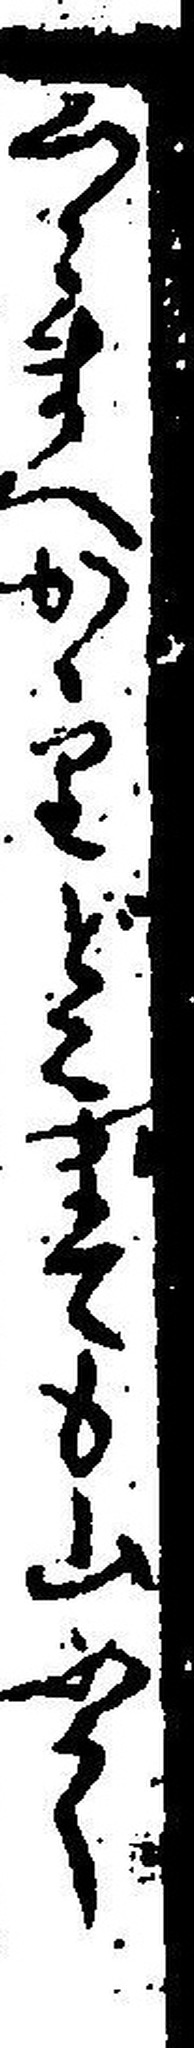くらまへかゝりどこまても山ふかく
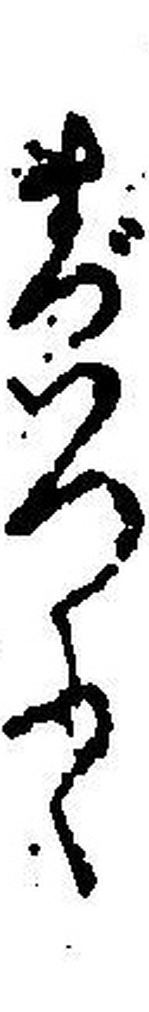まづいつふく
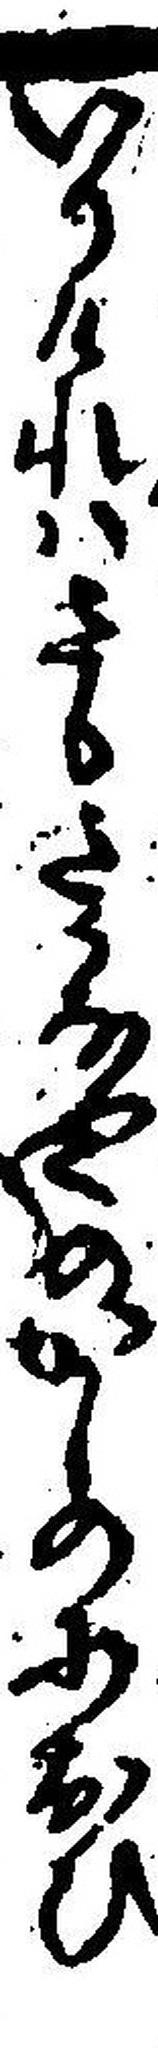いりけれはさもさかなやのかしのにおひ
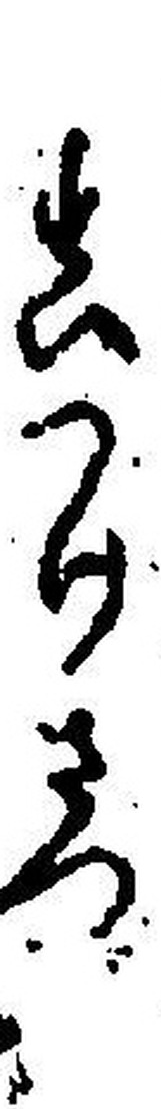すいつけさつ
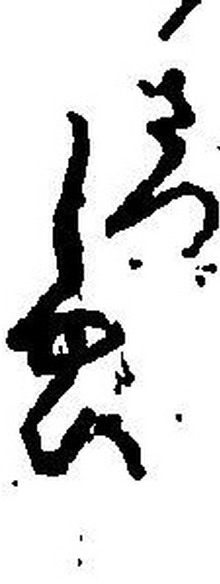しやい
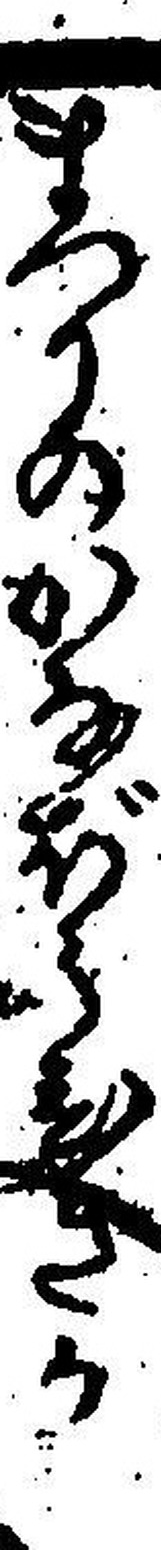まつりのかなぼうひきか
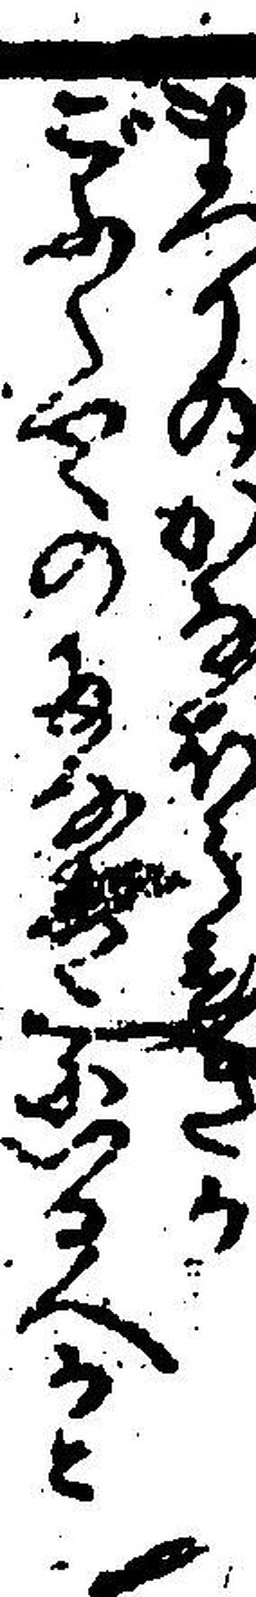ごふくやのたなしたにいる人かと
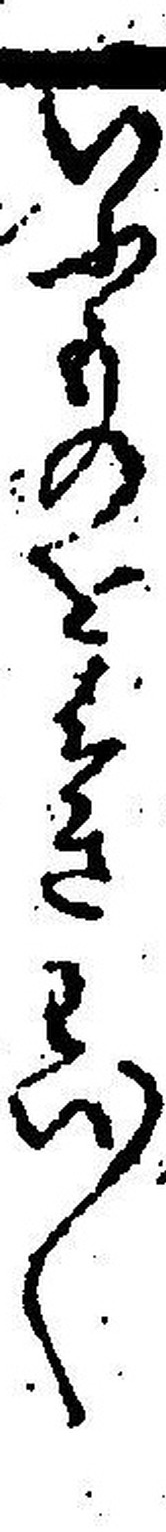いふものをはきわい〳〵
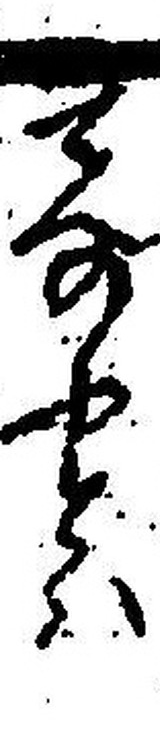てんのふとは
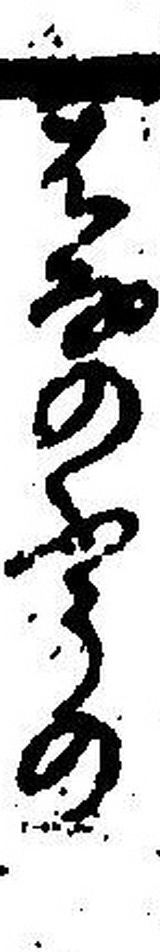はなのふうの
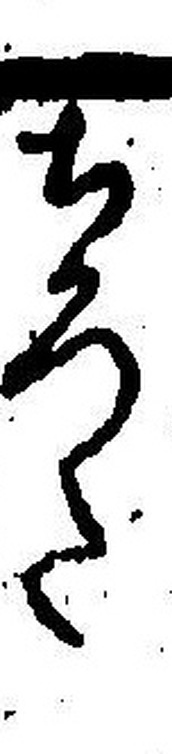ちかつた
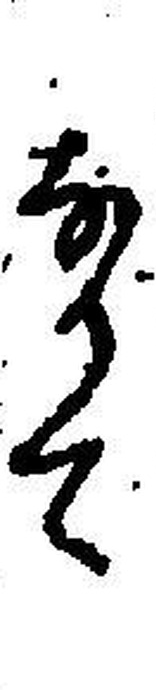なりて
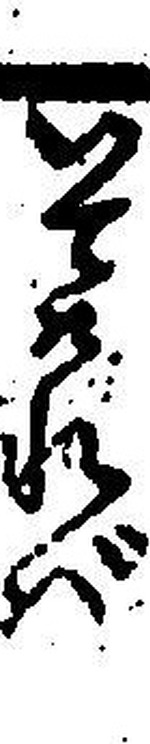いてければ
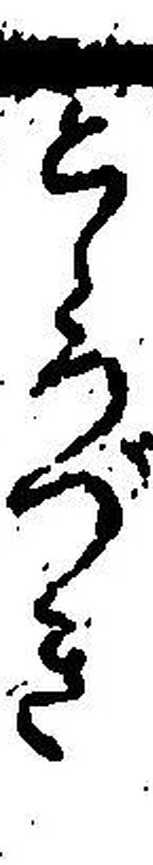こゝろづき
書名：牡丹餅棚有 / 市場通笑作
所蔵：東京大学総合図書館 General Library in the University of Tokyo, JAPAN
